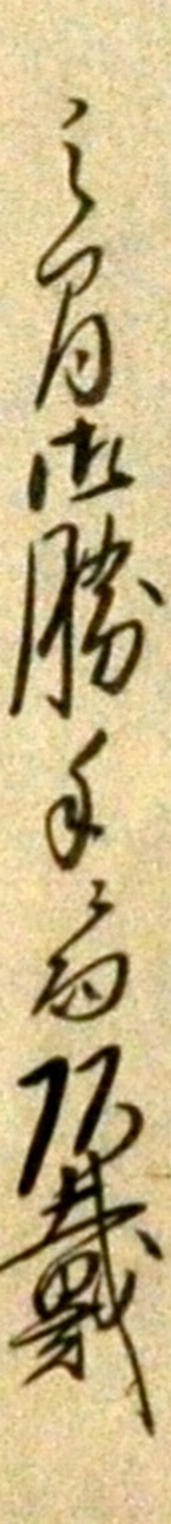之間御勝手ニ而頂戴
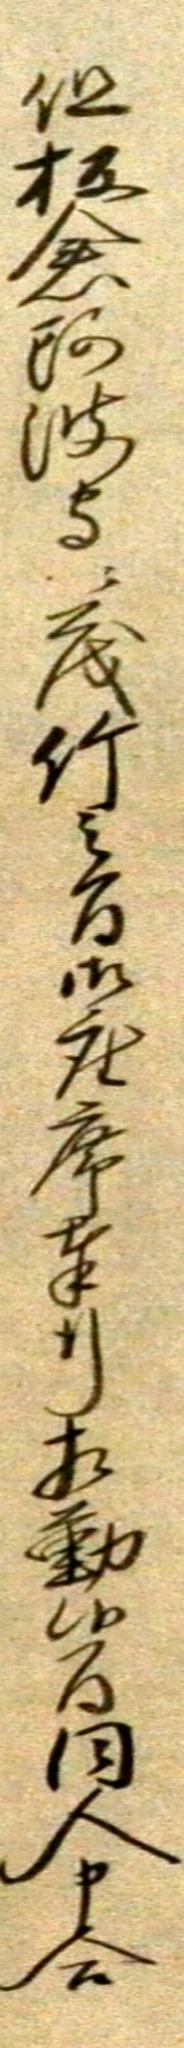但板倉阿波守ニも竹之間御座席奉行相勤候間同人申合
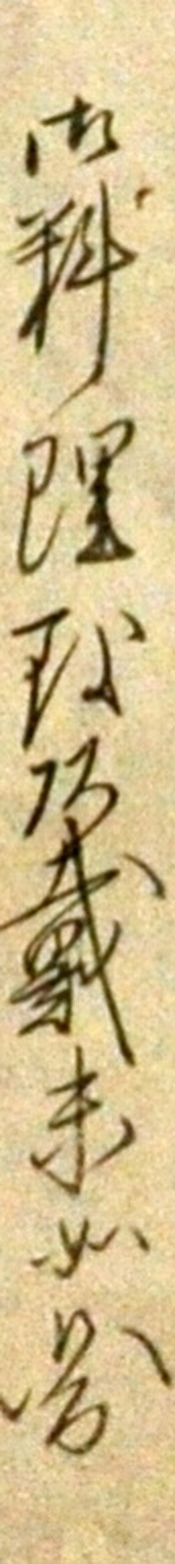御料理致頂戴末如図

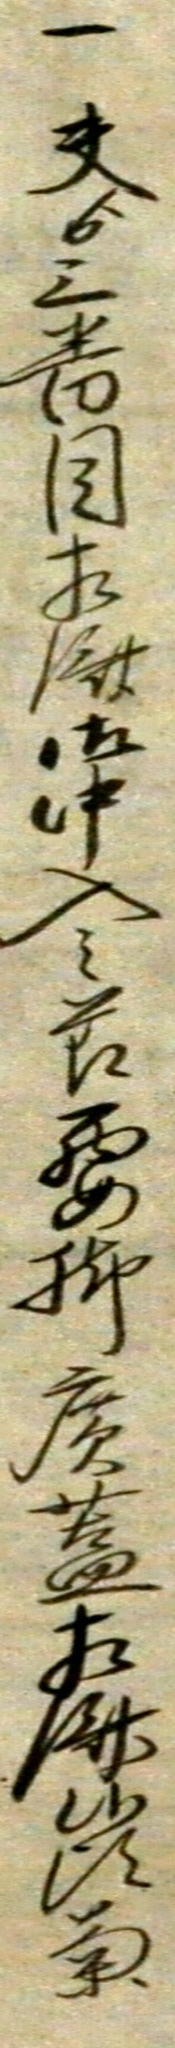一夫ゟ三番目相済御中入之節要脚広蓋相済候頃菊
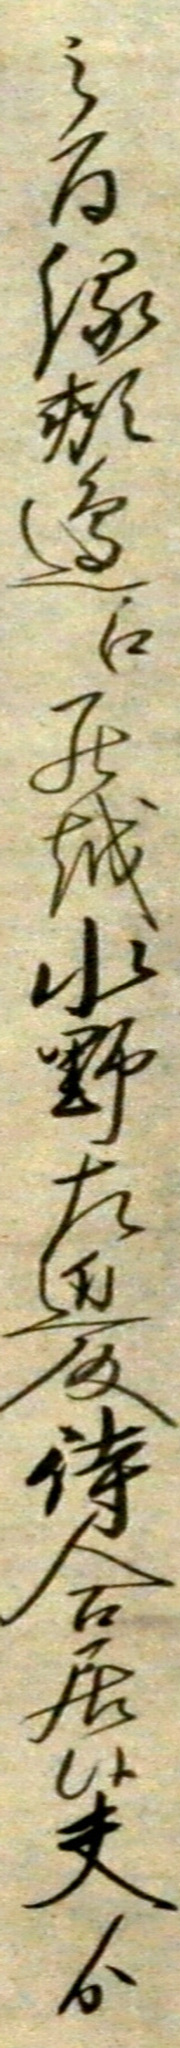之間縁頬辺え罷越水野左近殿待合居候夫ゟ
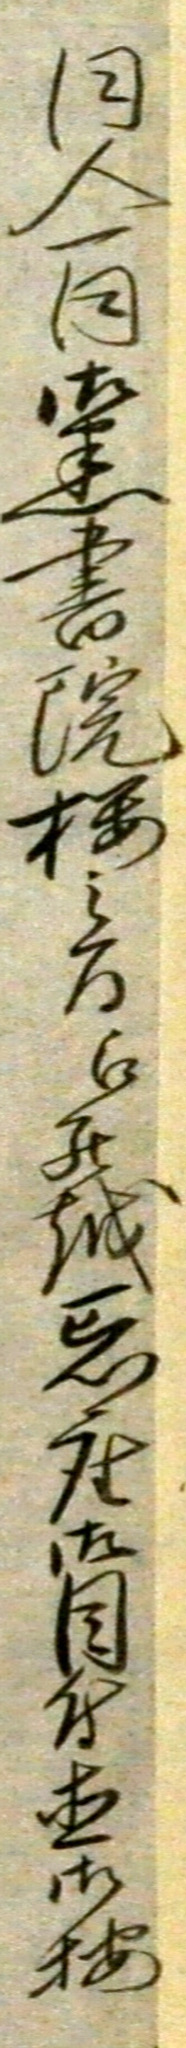同人一同御黒書院桜之間え罷越着座御目付直御按
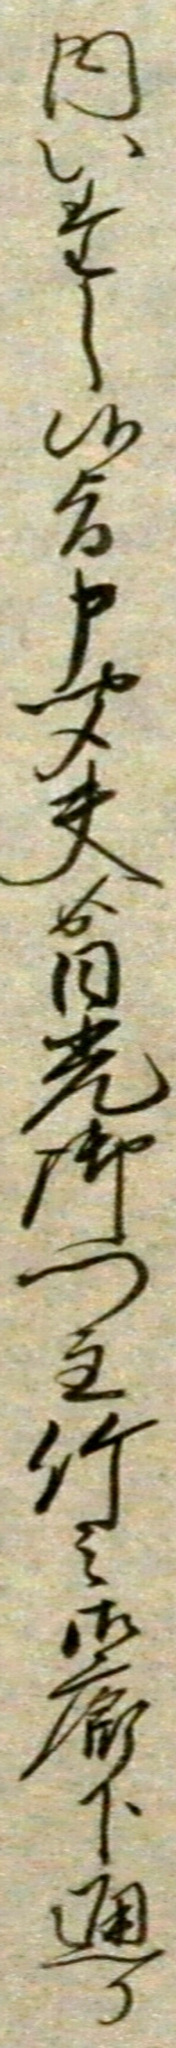内いたし候旨申聞夫ゟ日光御門主竹之御廊下通り
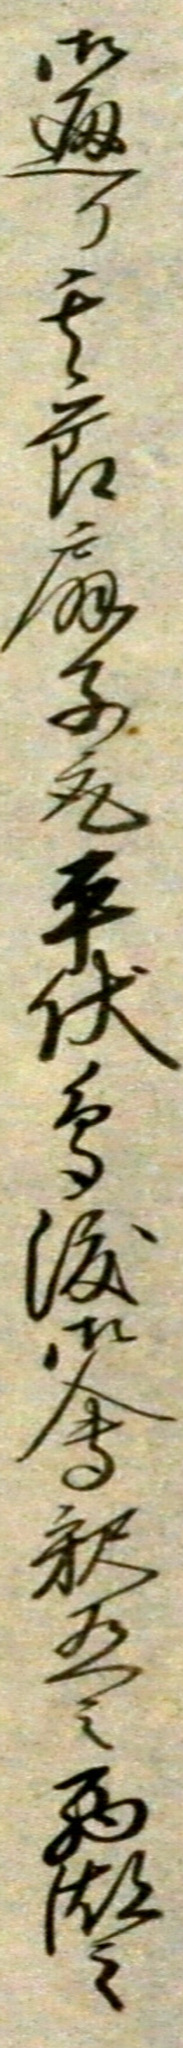御通り其節扇子取平伏鳥渡御会釈有之西湖之
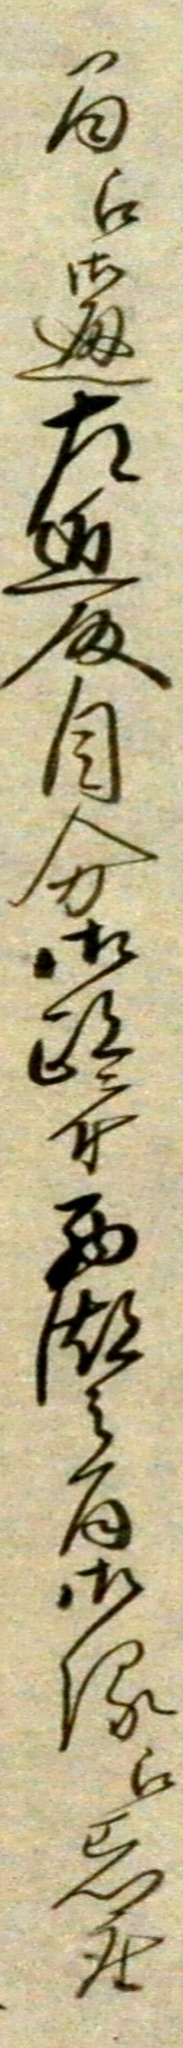間え御通左近殿自分御跡ニ付西湖之間御縁え着座
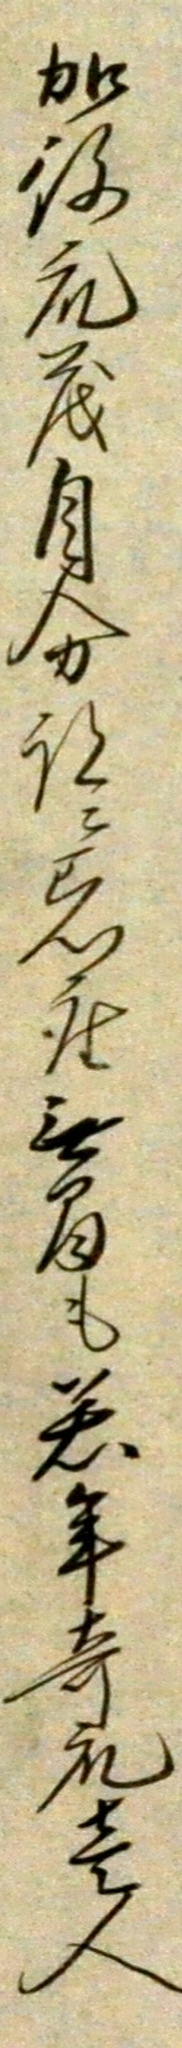加役衆も自分跡ニ着座無間も若年寄衆壱人
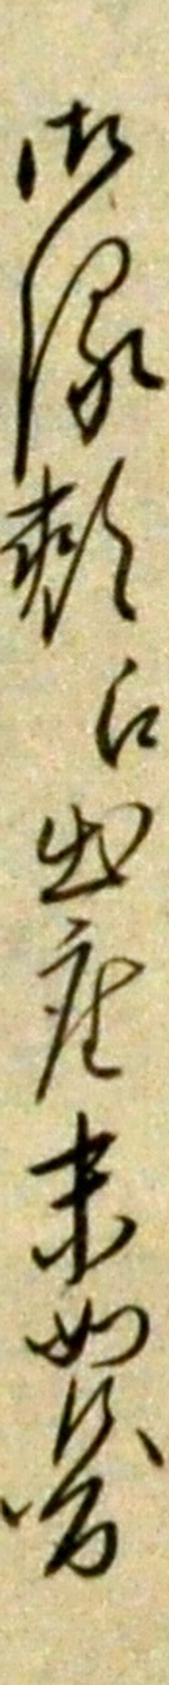御縁頬え出座末如図
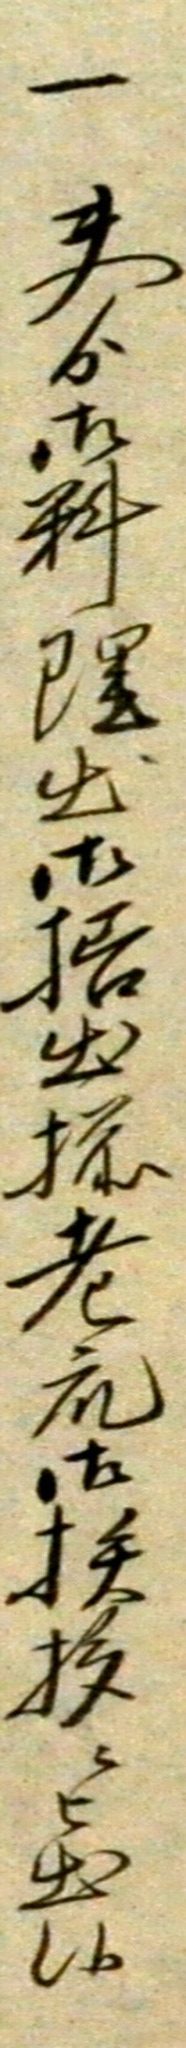一夫ゟ御料理出御膳出揃老衆御挨拶ニ被出候
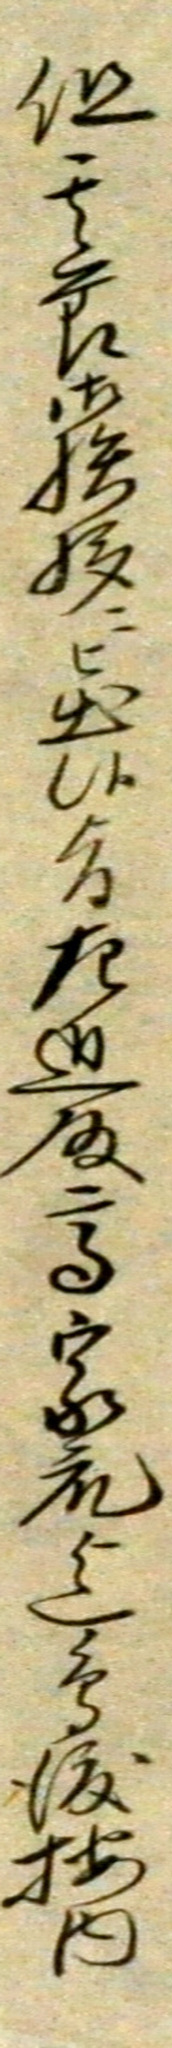但其節御挨拶ニ被出候旨左近殿高家衆迄鳥渡按内
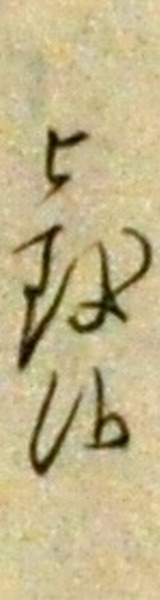被致候
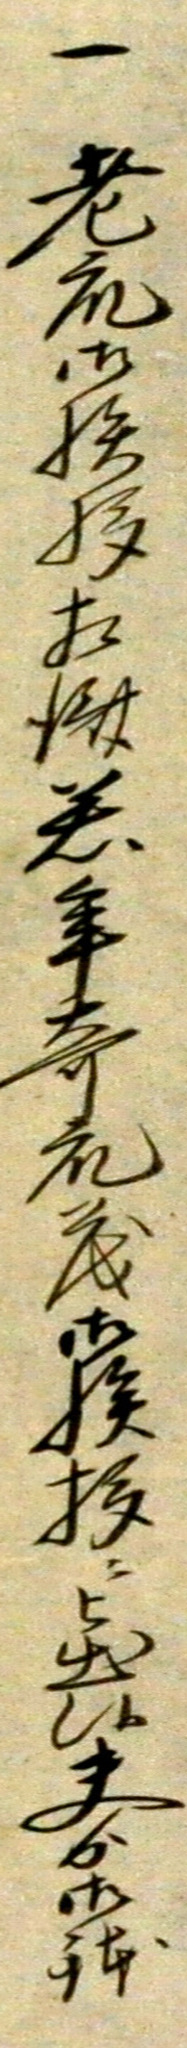一老衆御挨拶相済若年寄衆も御挨拶ニ被出候夫ゟ御鉢
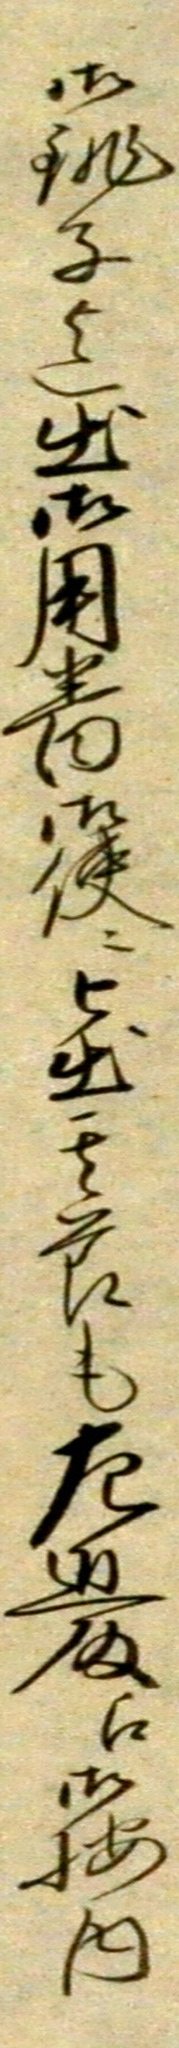御銚子迄出御用番御使ニ被出其節も左近殿え御按内
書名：右大将様御疱瘡済御能、西湖ノ間御座席奉行勤候節ノ留
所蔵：伊那市立高遠町図書館・合同会社AMANE
